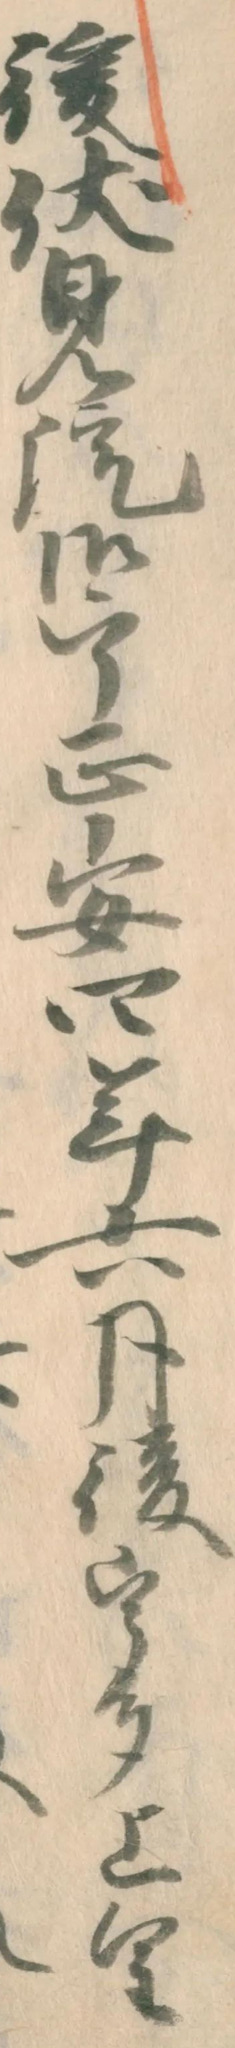後伏見院御宇正安四年六月後宇多上皇
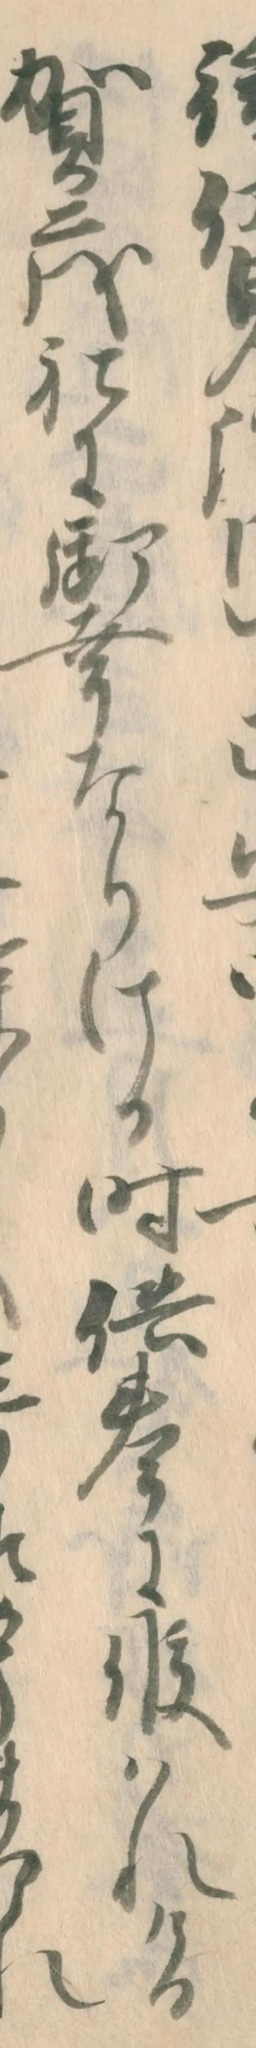賀茂社に御幸なりける時供奏に候はれける
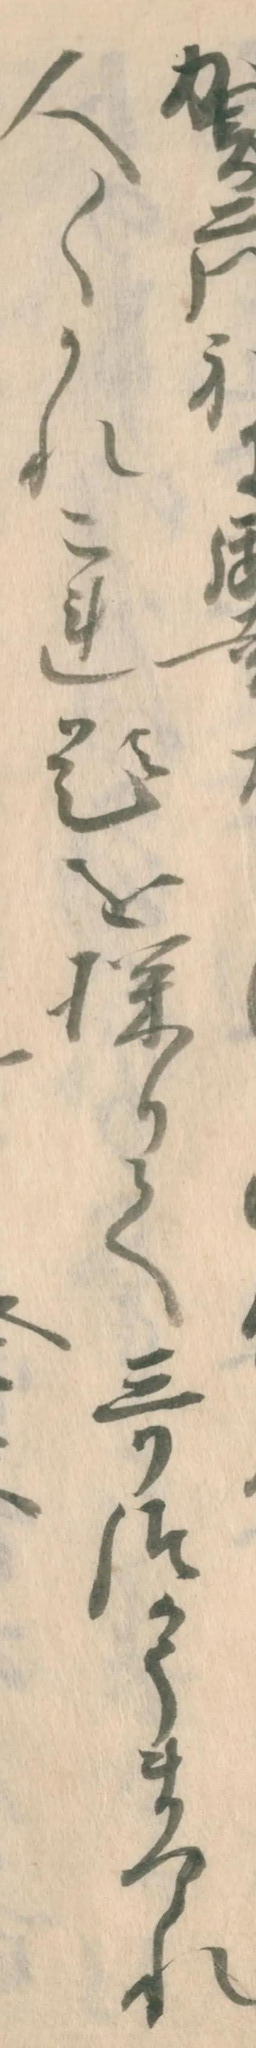人〳〵かれこれ題を探りて哥つかうまつられ
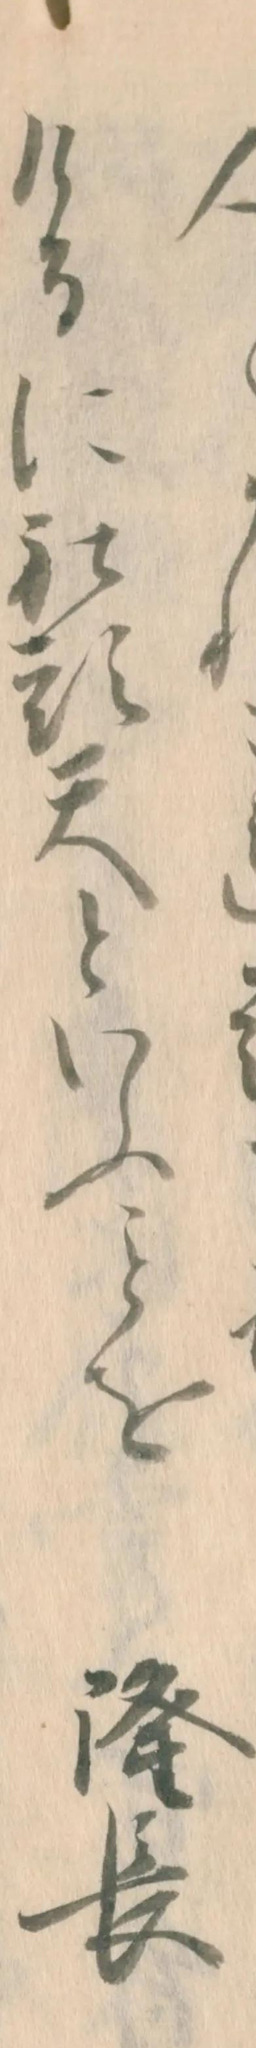けるに社頭天といふことを隆長
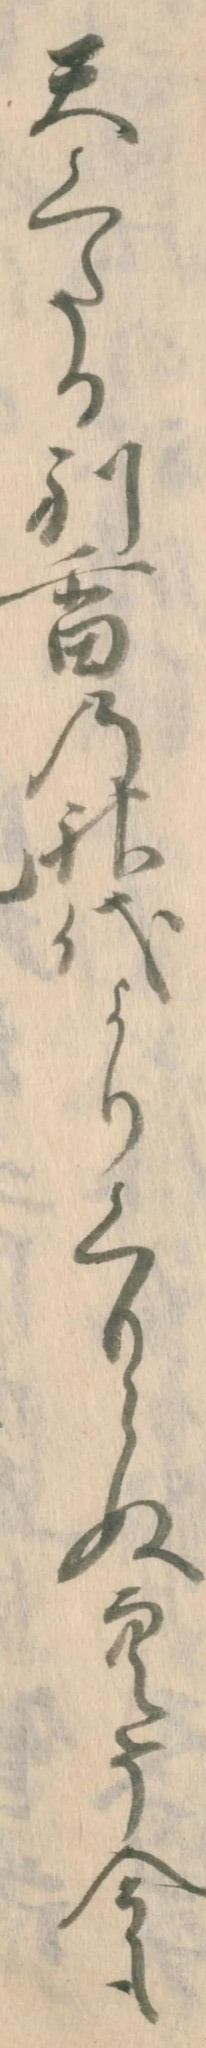天くたる別雷の神代よりくもらぬ空そ今も
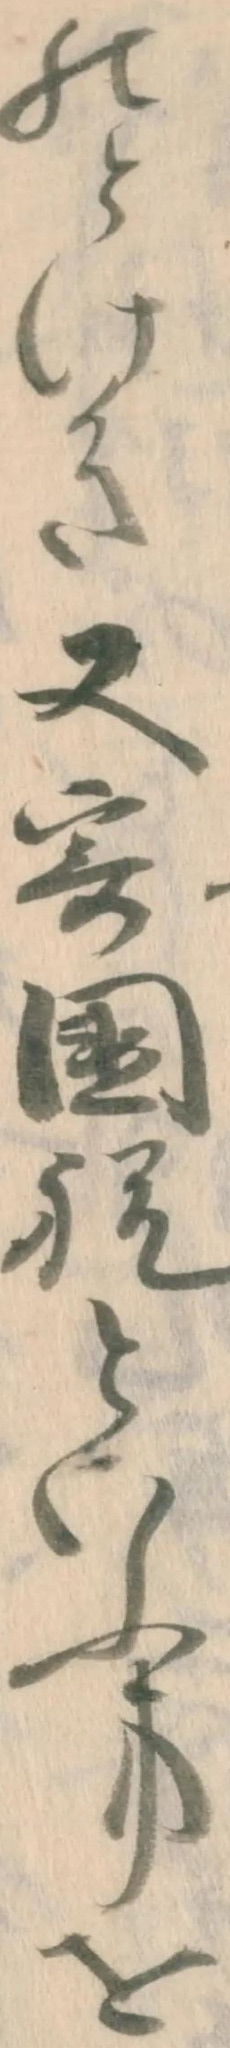のとけき又寄国祝といふ事を
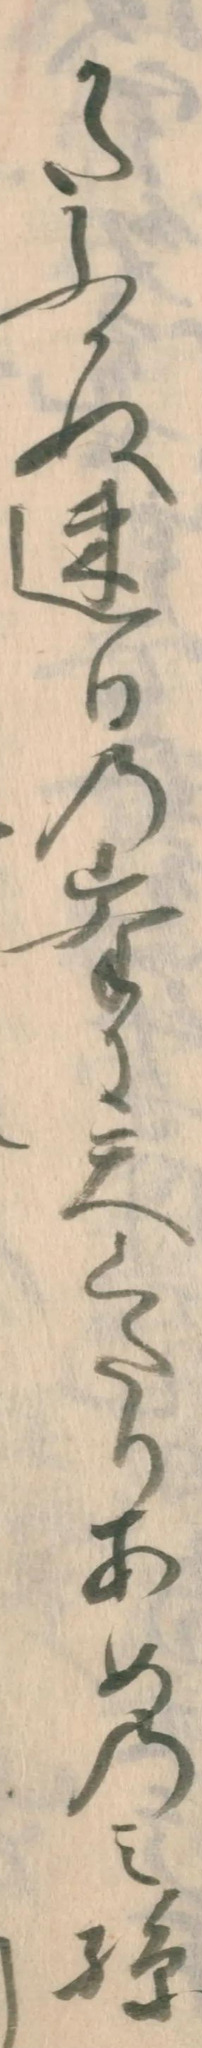かたふかぬ速日の峯に天くたりあめのみ孫
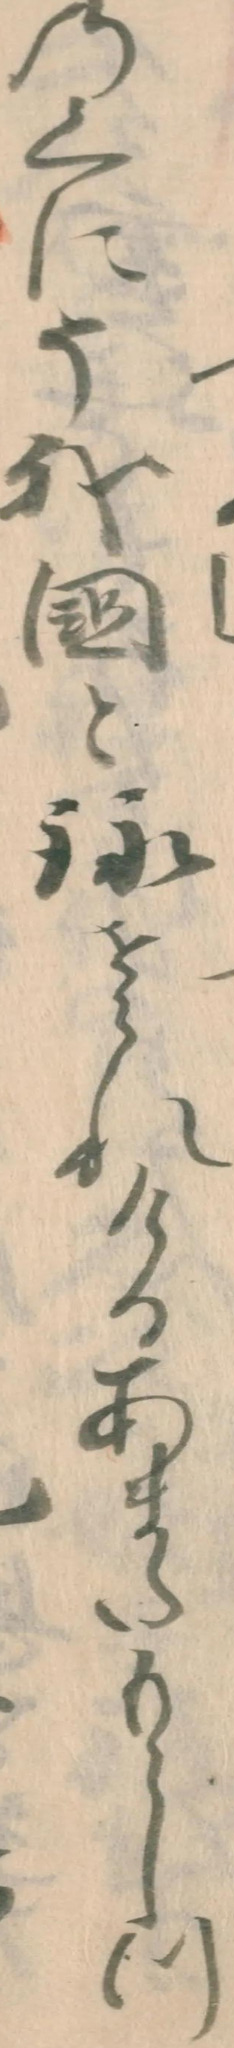のくにそ我国と詠せられけるあまたもらしつ
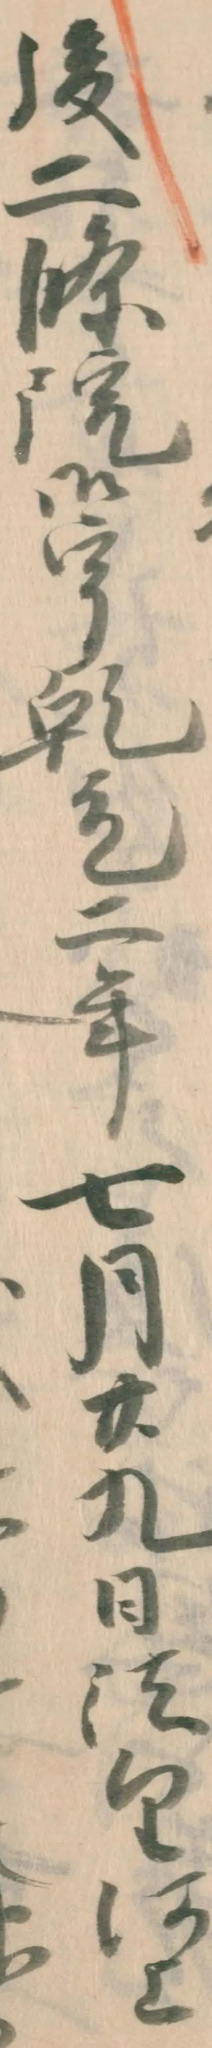後二條院御宇乾元二年七月廿九日法皇河上
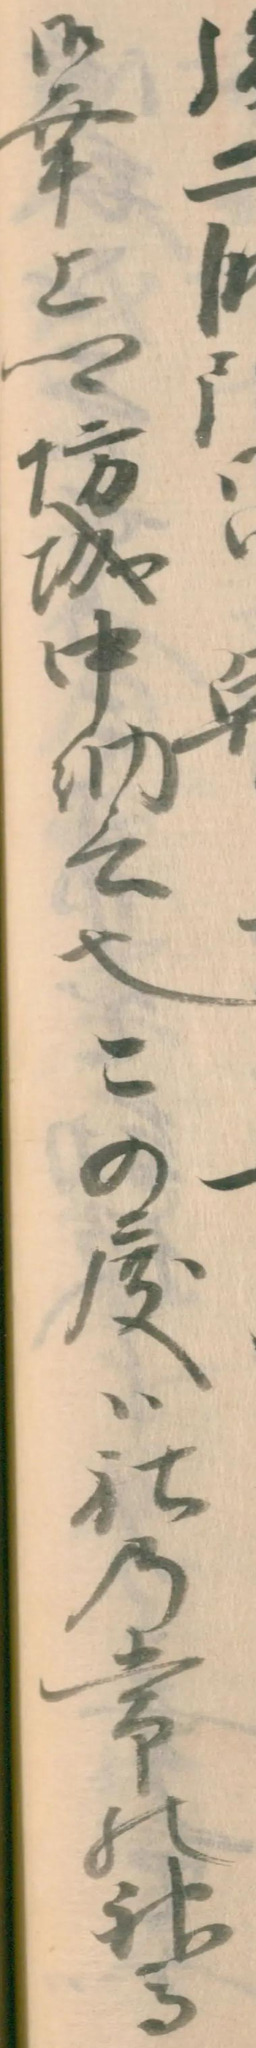御幸上卿坊城中納言也この度は社の常の神馬
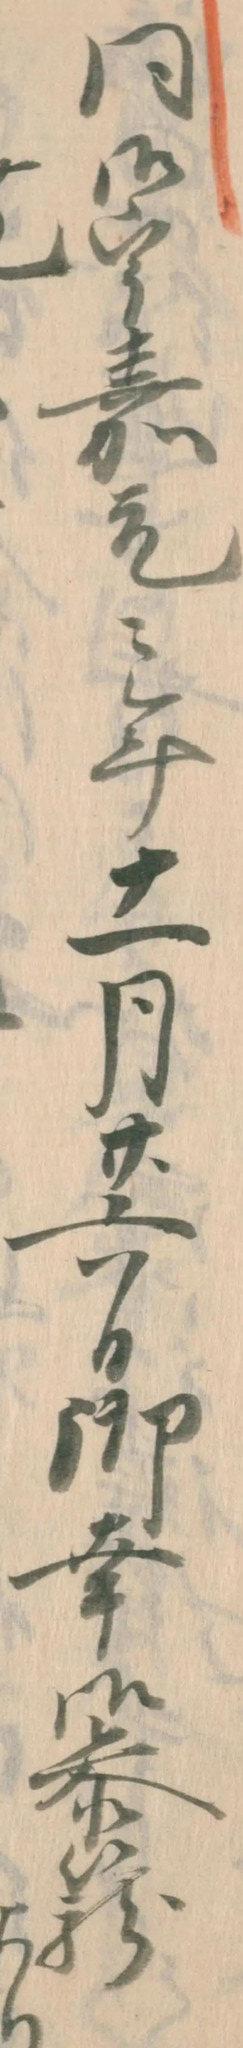同御宇嘉元々年十一月廿六日御幸御参籠あり
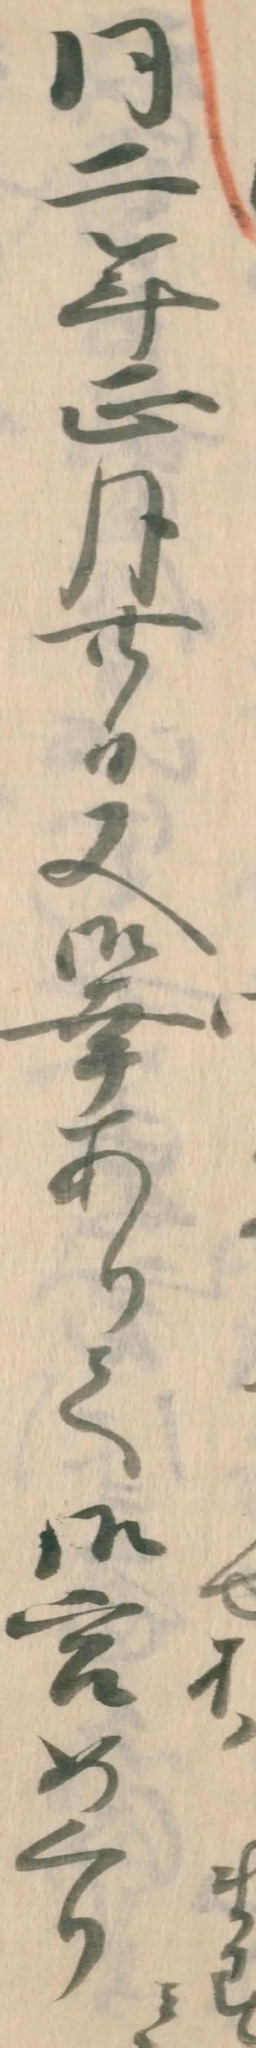同二年正月廿日又御幸ありて御宮めくり
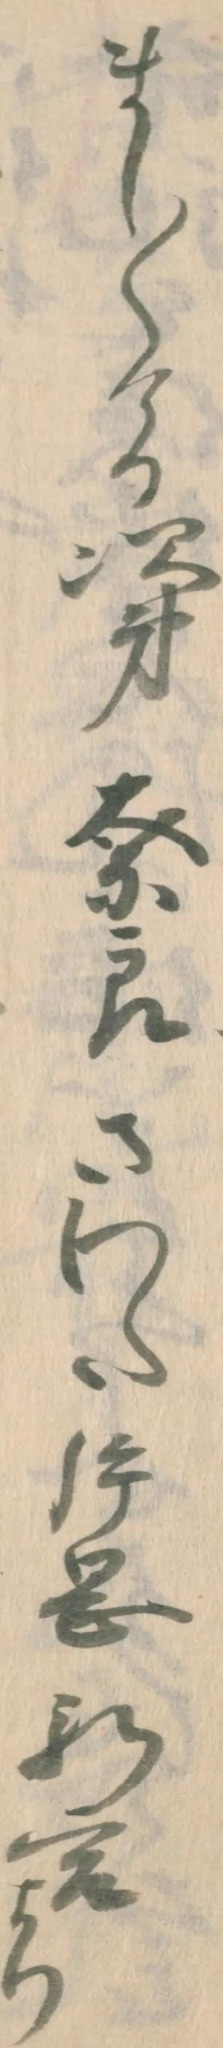まし〳〵ける次第奈良さわた片岡新宮より
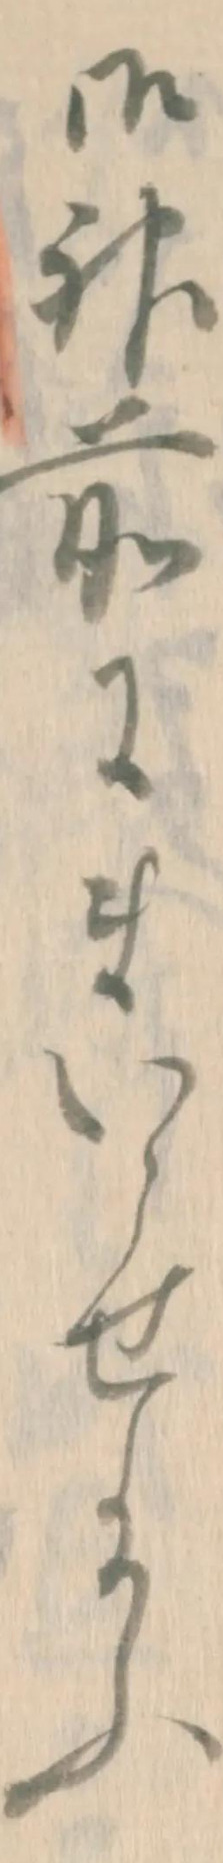御神前にまいらせ給ふ
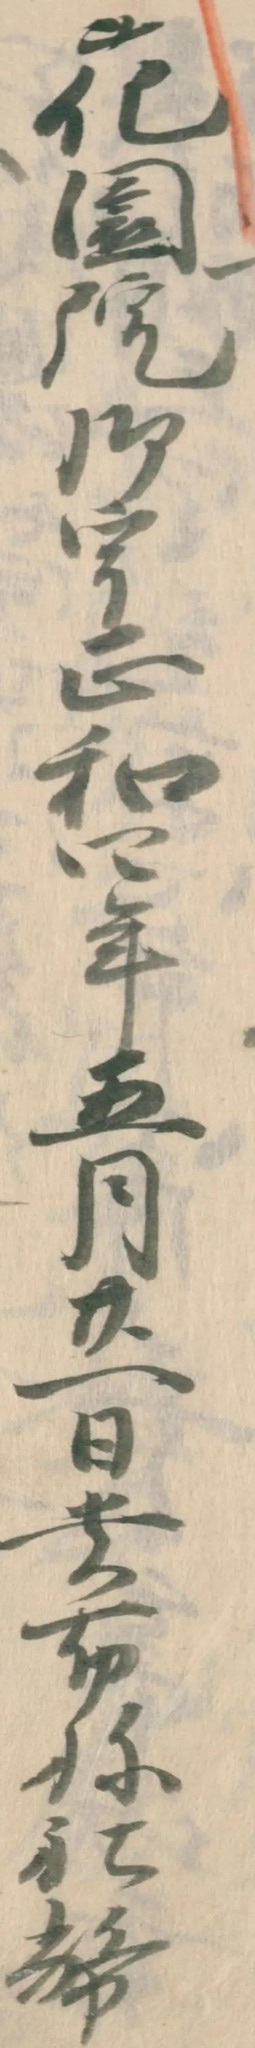花園院御宇正和四年五月廿一日貴ふね社幣
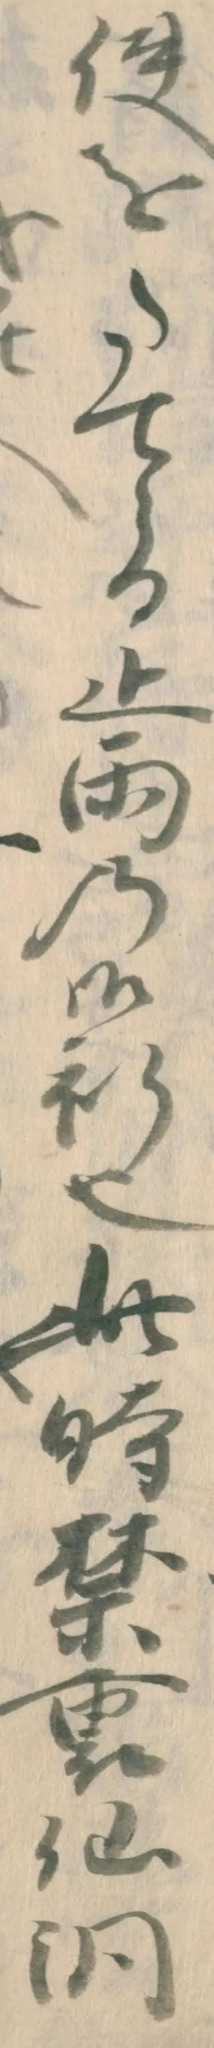使をたてらる止雨の御祈也此時禁裏仙洞
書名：賀茂社記録. 第1冊
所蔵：国立国会図書館 National Diet Library, JAPAN
